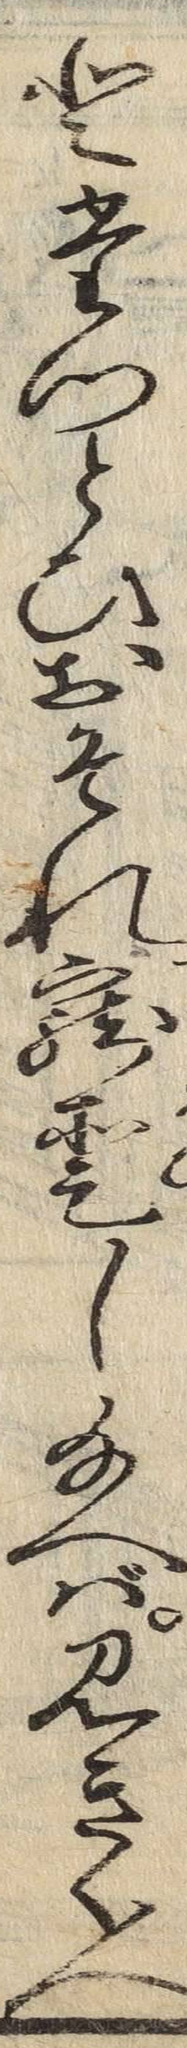とたつとひおそれ寵愛し給へば。見きく人
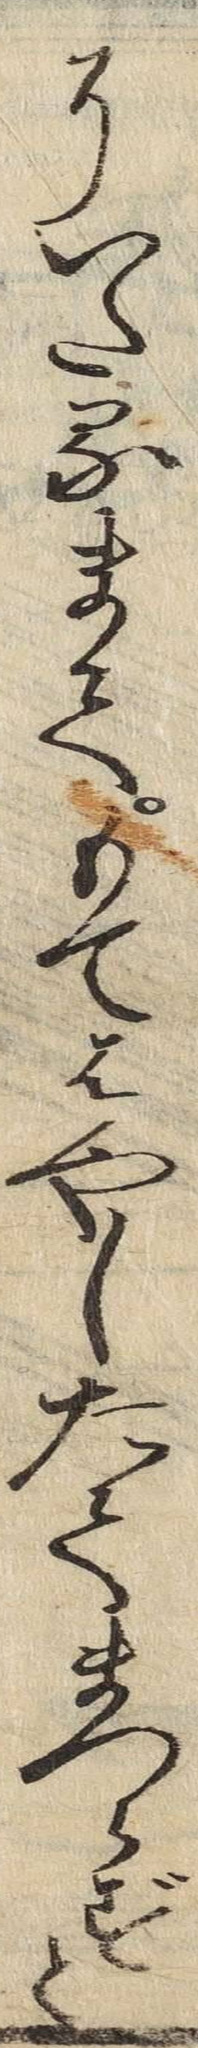にいたるまて。もてはやしたてまつらずと
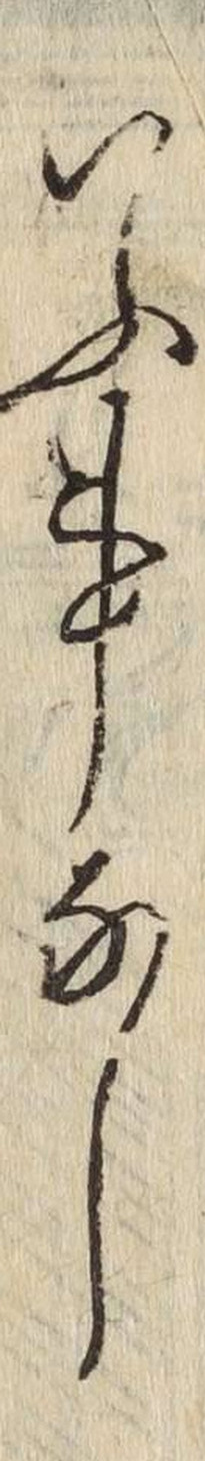いふ事なし

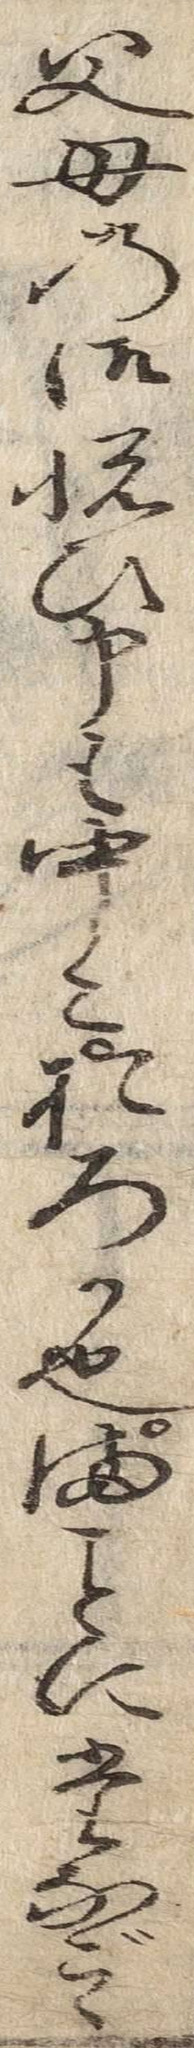父母の喜ひ申も中々。おろか也。まことにたなごゝ
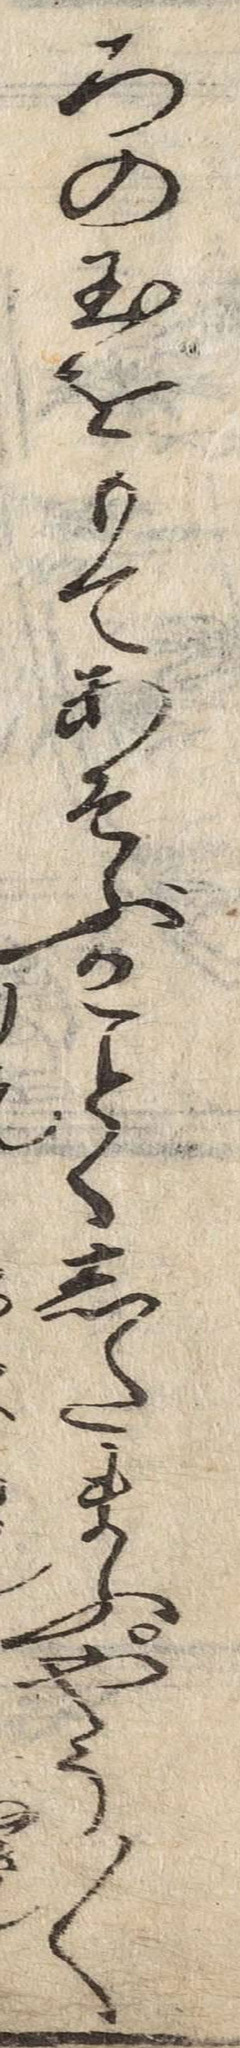ろの玉をもてあそぶかことくしたまふ。やう〳〵
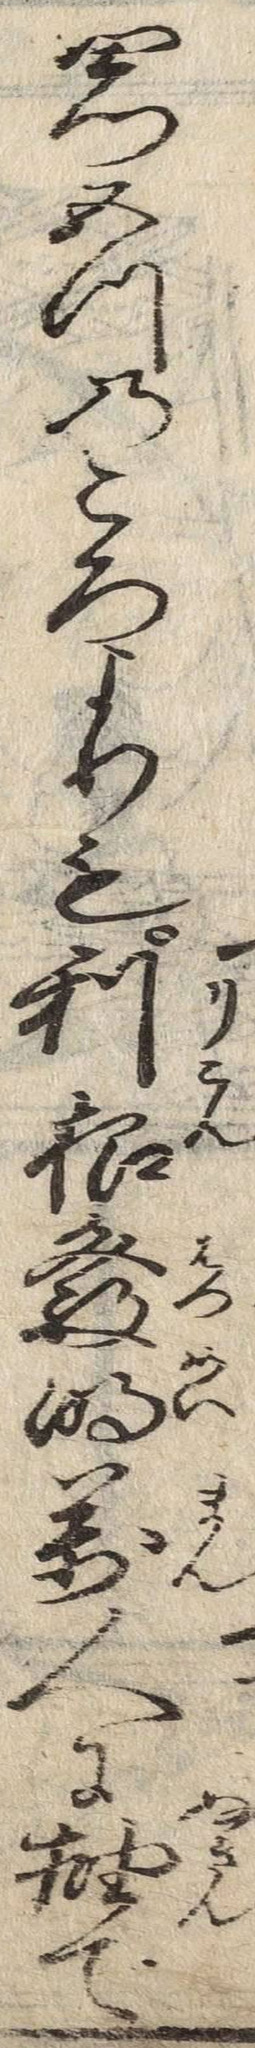四つ五つのころよりも。利根発明万人に抽で
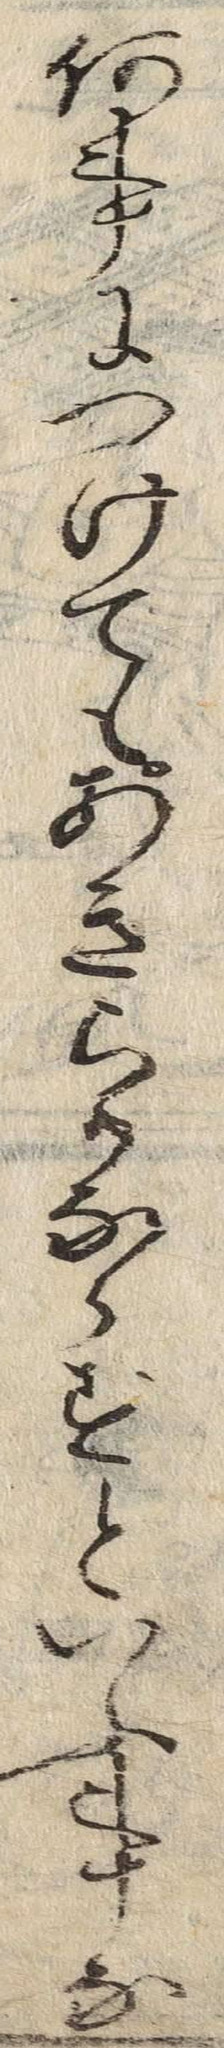て何事につけてもあきらかならずといふ事な
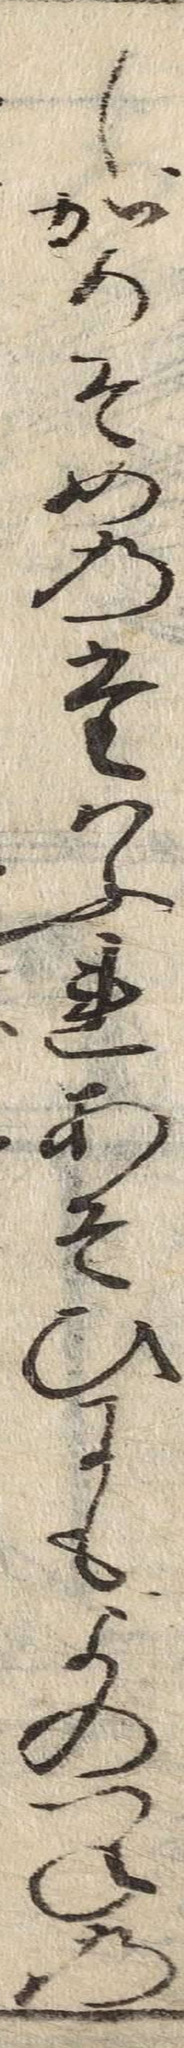し。かりそめのたはふれあそひにも。よのつねの
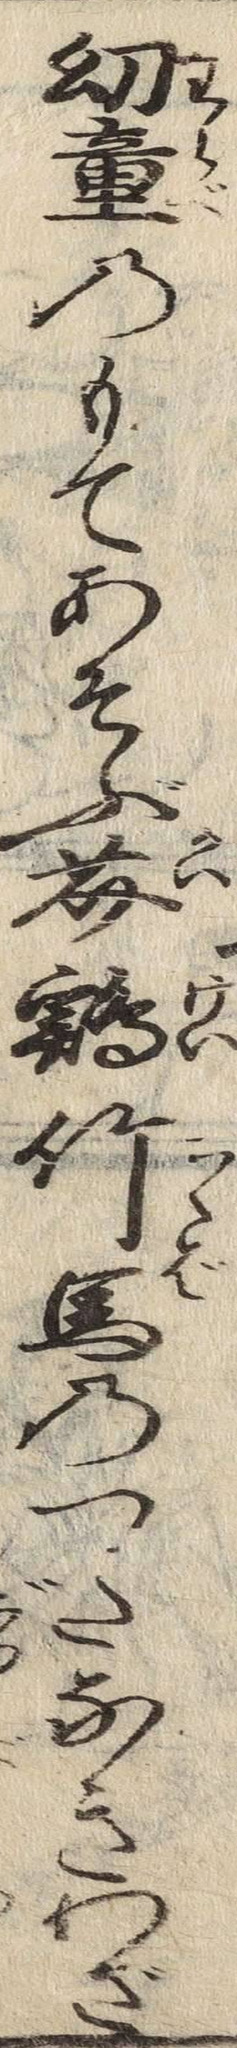幼童のもてあそぶ芥鶏行馬のつたなきわざ
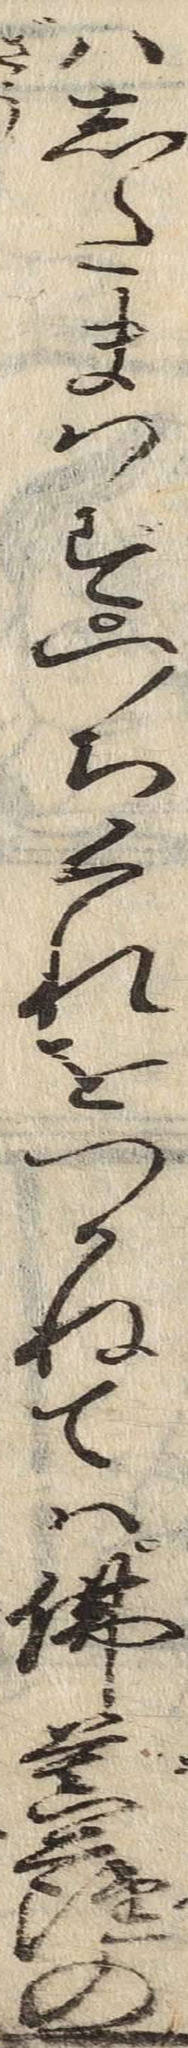はしたまはず。つちくれをつかねては。仏菩薩の
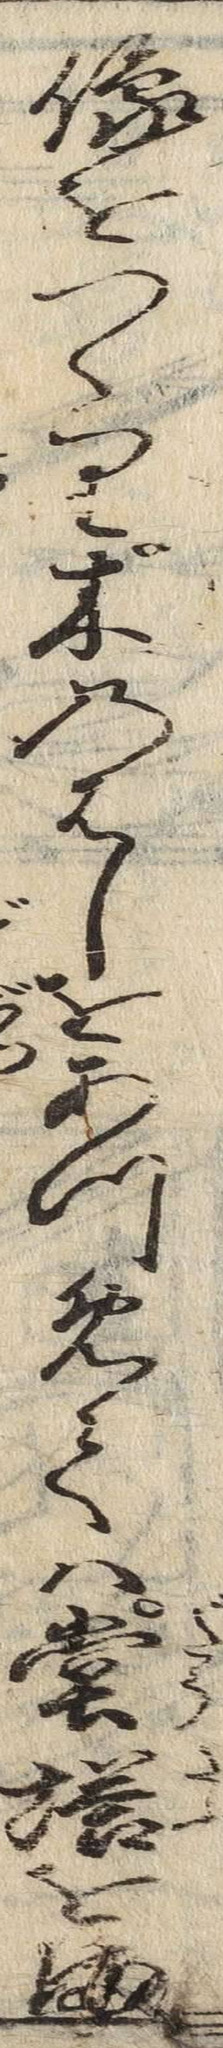像をつくり。木のはしをあつめては。堂塔をま
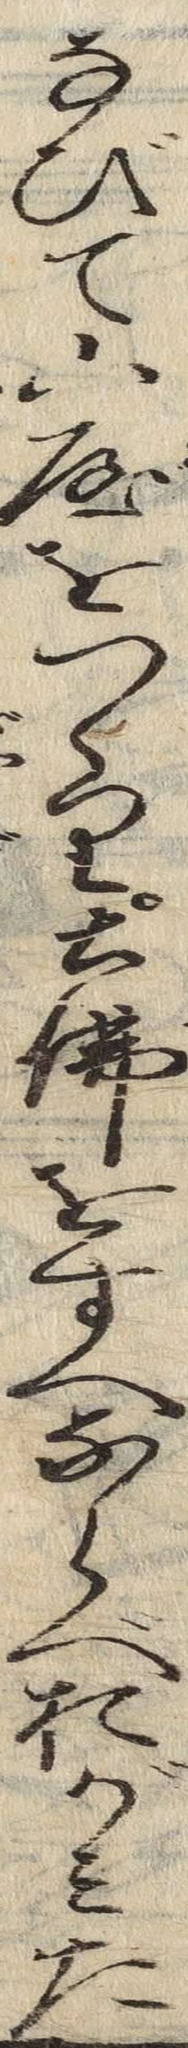なびて小屋をつくり。土仏をすへならべおかみた
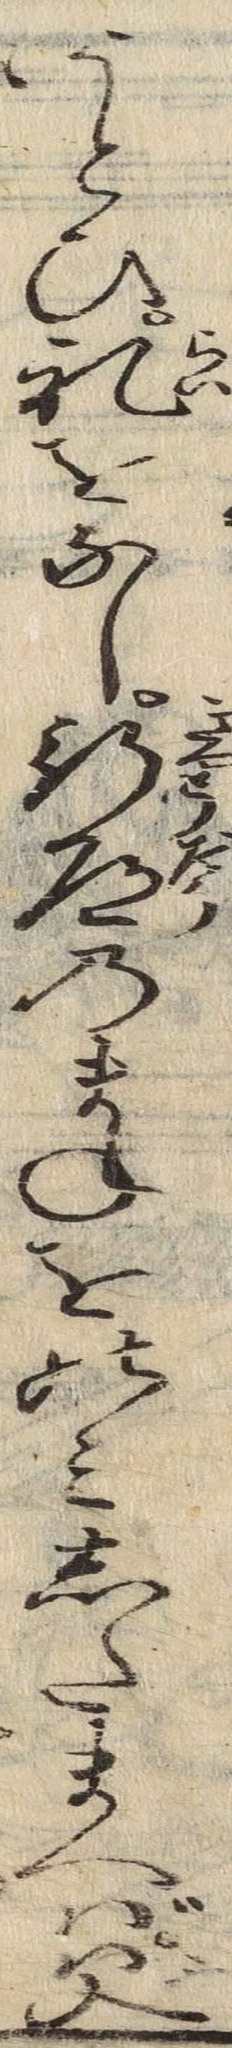うとひ。礼をなし。行道のまねを能くしたまへば。父
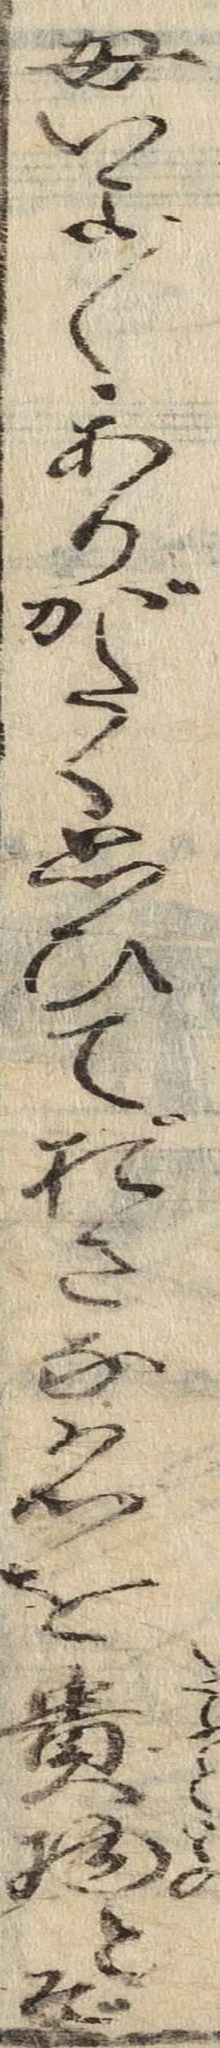母いよ〳〵ありがたく思ひて。おさな名を貴物とぞ
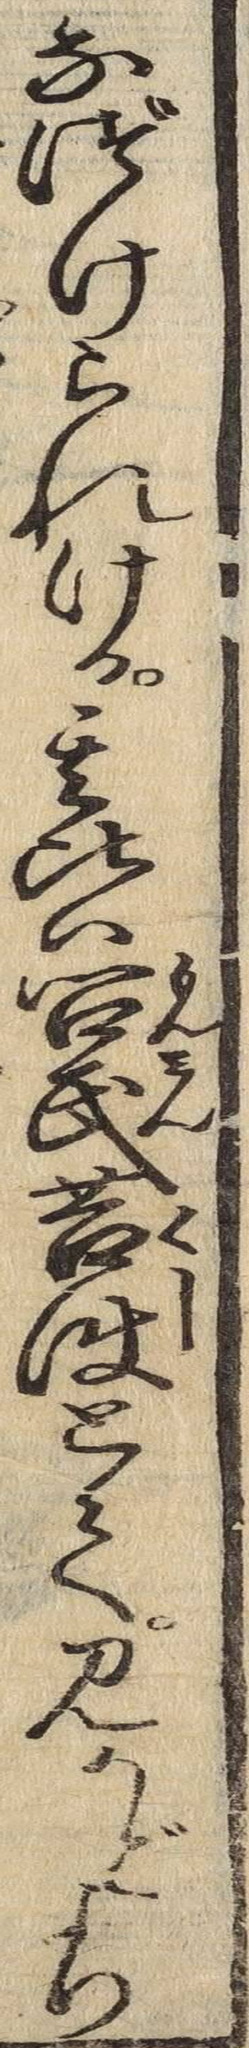なづけられける。其頃は問民苦使とて。みかどより
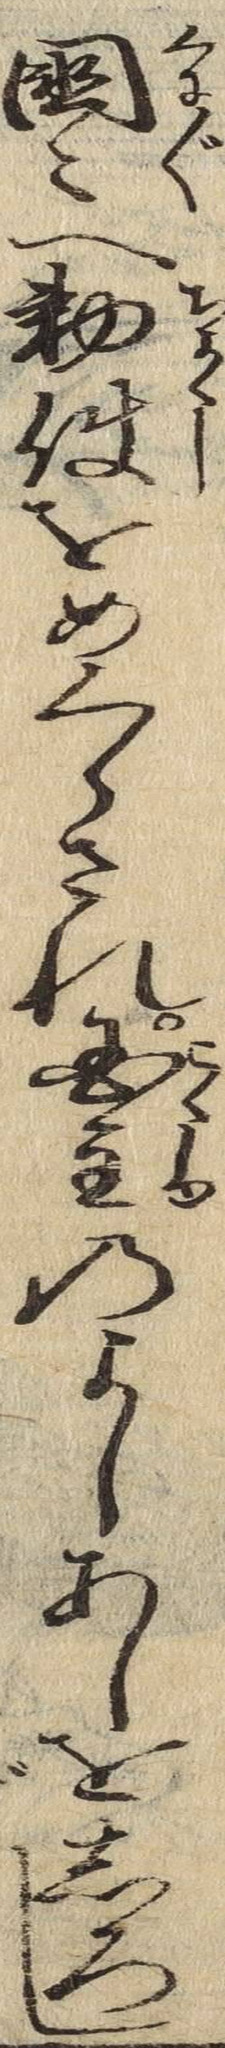国々へ勅使をめくらされ。国主のよしあしをしろし
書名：弘法大師御傳記
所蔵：京都府立京都学・歴彩館 国文学研究資料館
